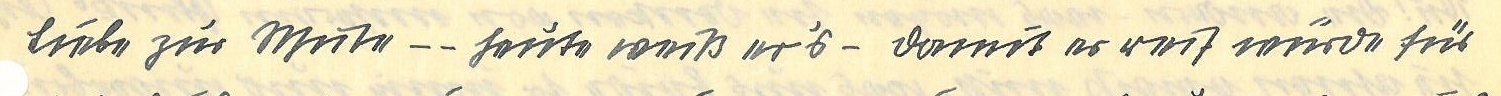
Liebe zur Schule – – heute weiß er’s – damit er reif würde für
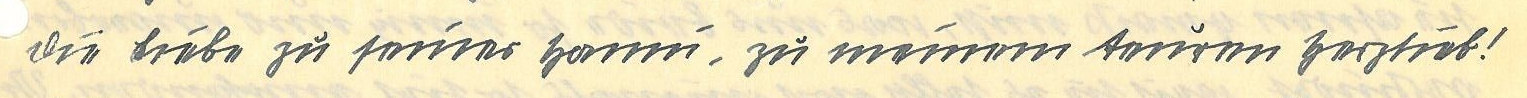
die Liebe zu seiner , zu meinem teuren Herzlieb!
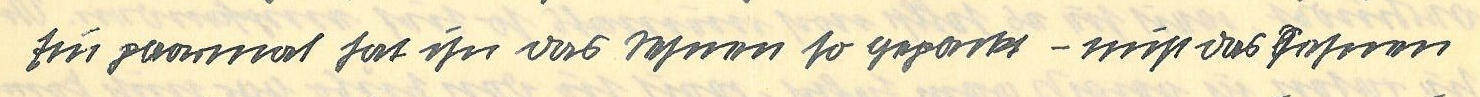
Ein paarmal hat ihn das Sehnen so gepackt – nicht das Sehnen
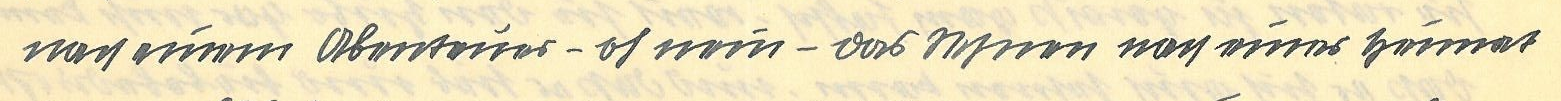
nach einem Abenteuer – oh nein – das Sehnen nach einer Heimat
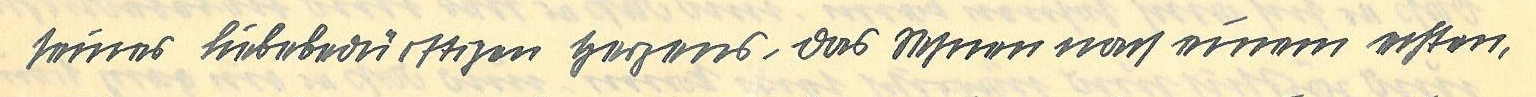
seines liebebedürftigen Herzens, das Sehnen nach einem echten,
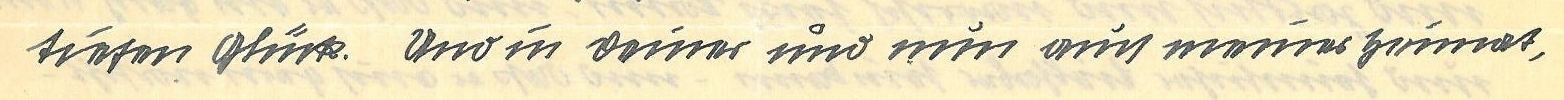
tiefen Glück. Und in Deiner und nun auch in meiner Heimat,
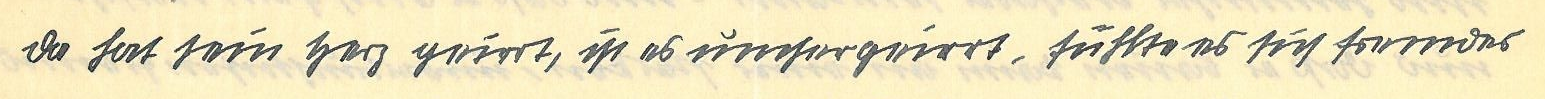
da hat sein Herz geirrt, ist es umhergeirrt, fühlte es sich fremder
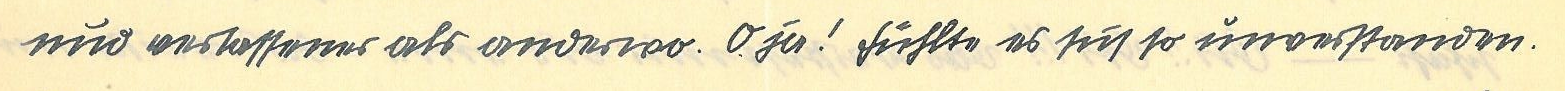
und verlassener als anderswo. O ja! Fühlte es sich unverstanden.
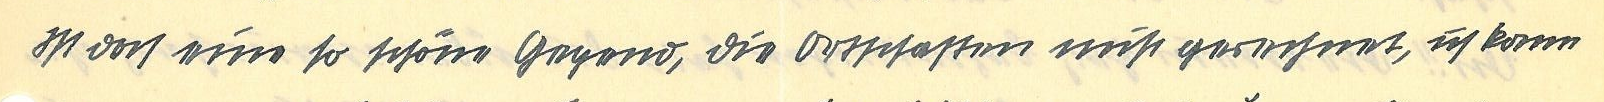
Ist doch eine so schöne Gegend, die Ortschaften nicht gerechnet, ich kann
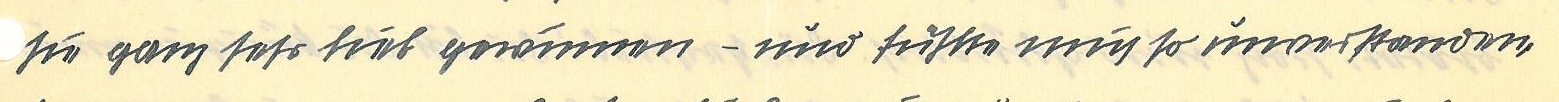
sie ganz sehr lieb gewinnen – und fühlte mich so unverstanden,
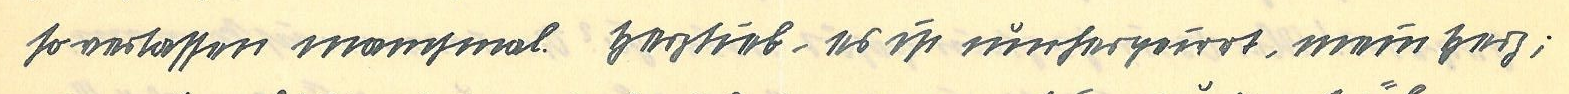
so verlassen manchmal. Herzlieb – es ist umhergeirrt, mein Herz;
